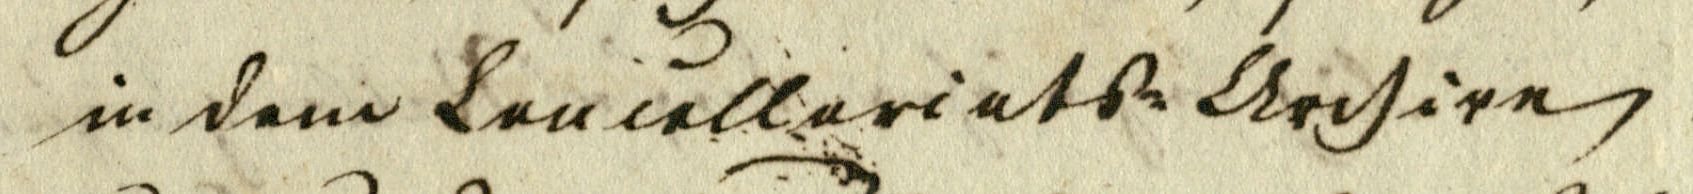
in dem Cancellariats- Archive
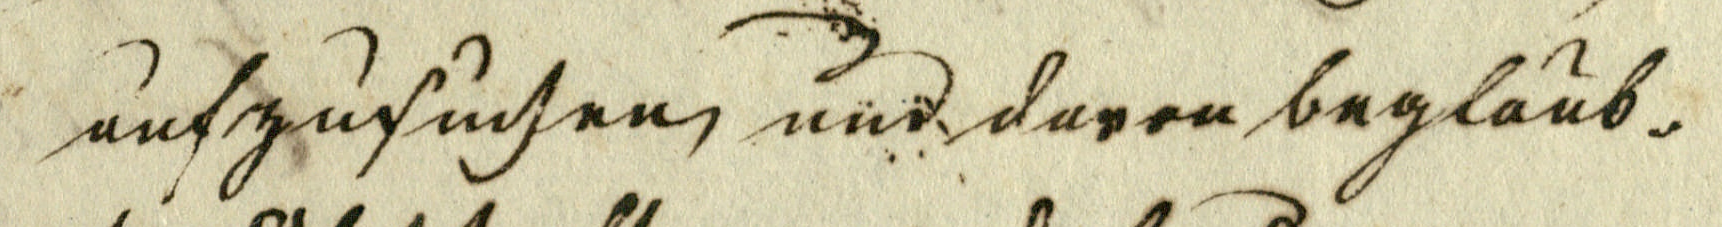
aufzusuchen, und davon beglaub¬
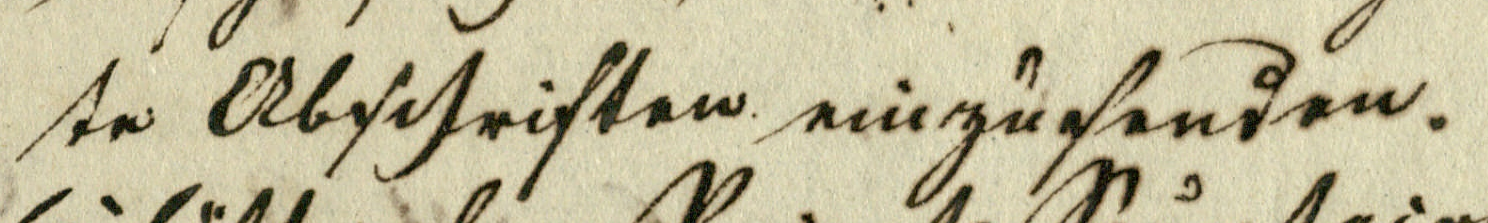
te Abschriften einzusenden.
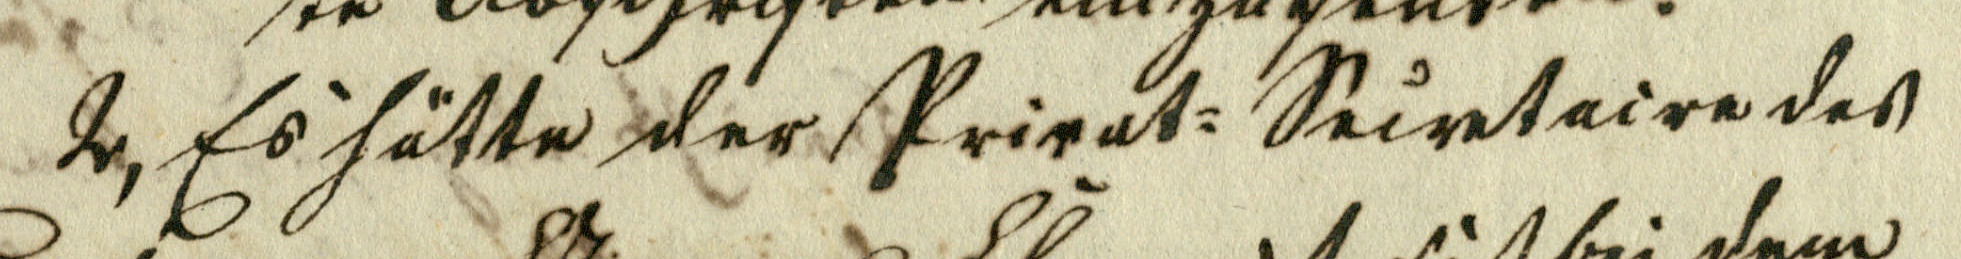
2., Es hätte der Privat Secretaire des
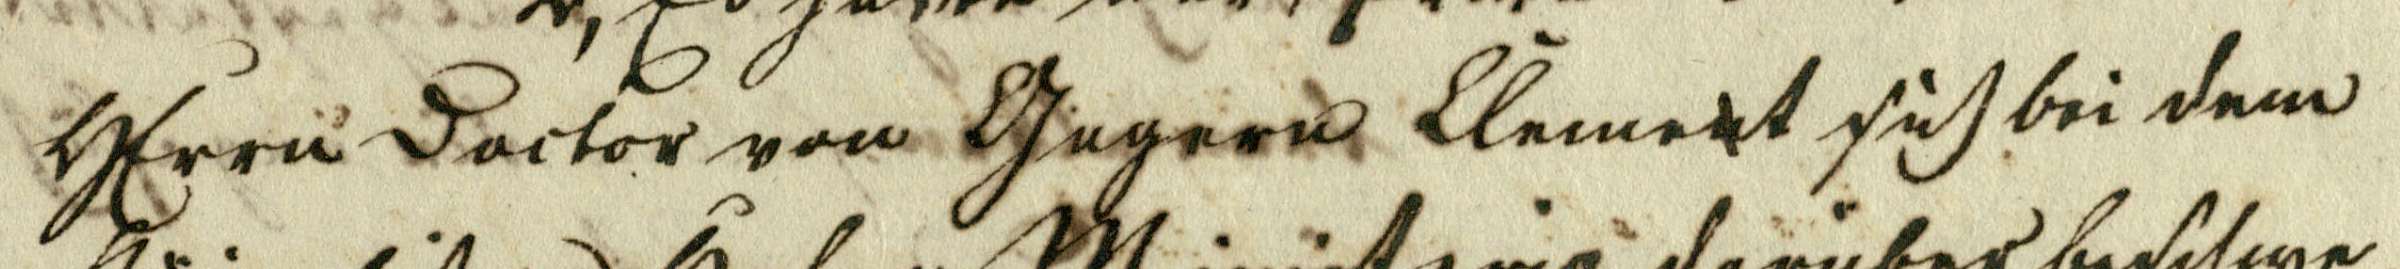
Herrn Doctor von Gagern Clemet sich bei dem
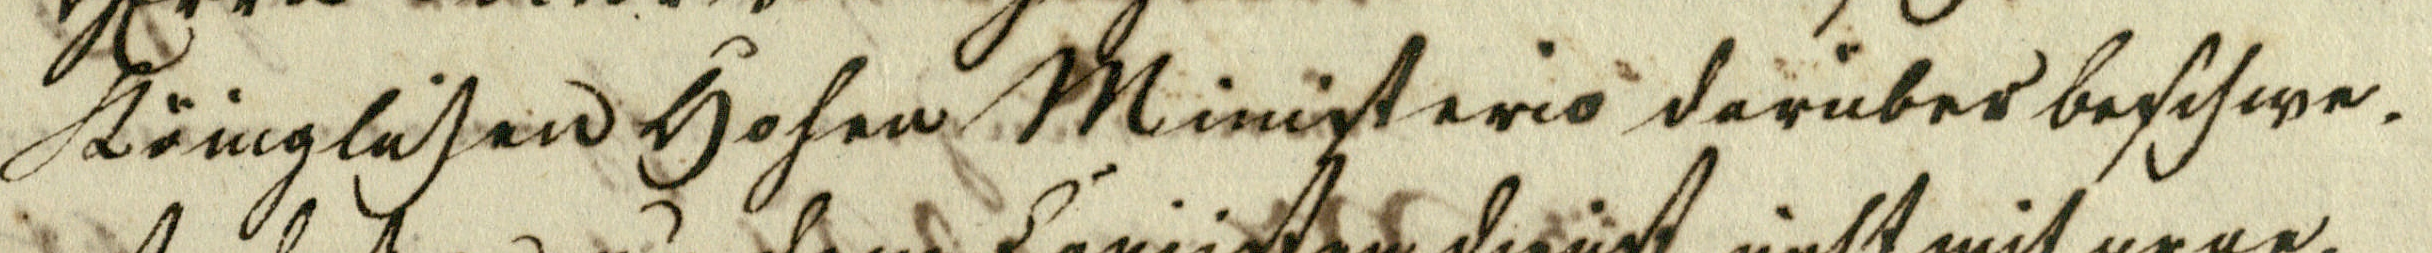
Königlichen Hohen Ministerio darüber beschwe¬
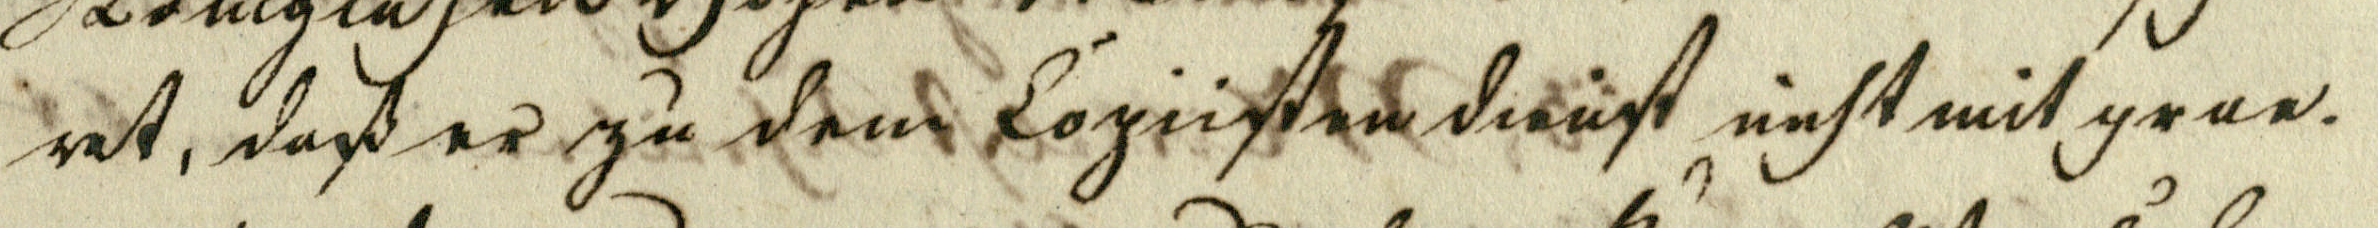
ret, daß er zu dem Copiistedienst der nicht mit prae¬
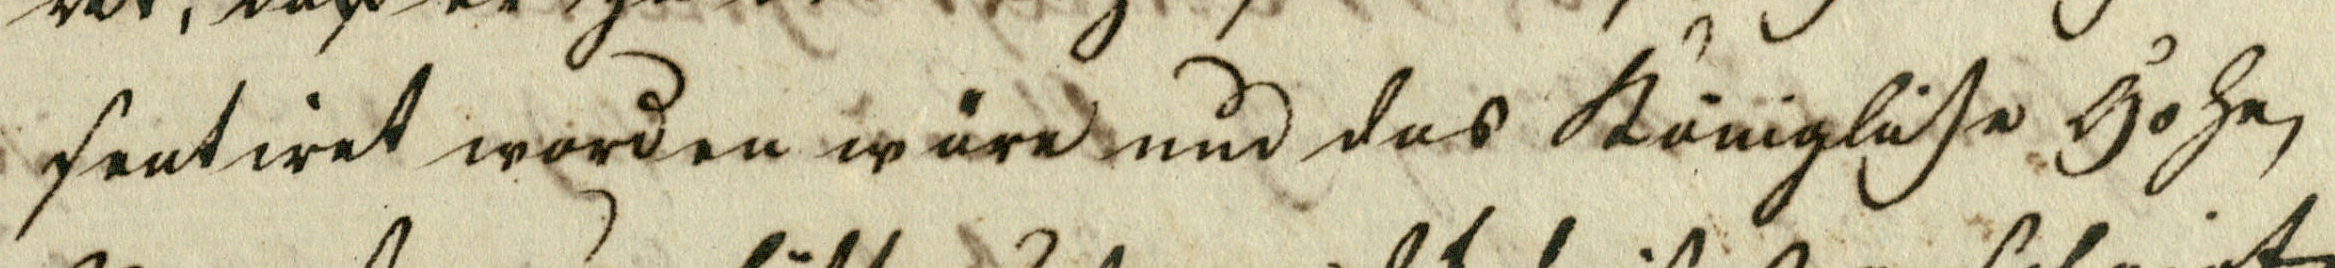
sentiret worden wäre und das Königliche Hohe
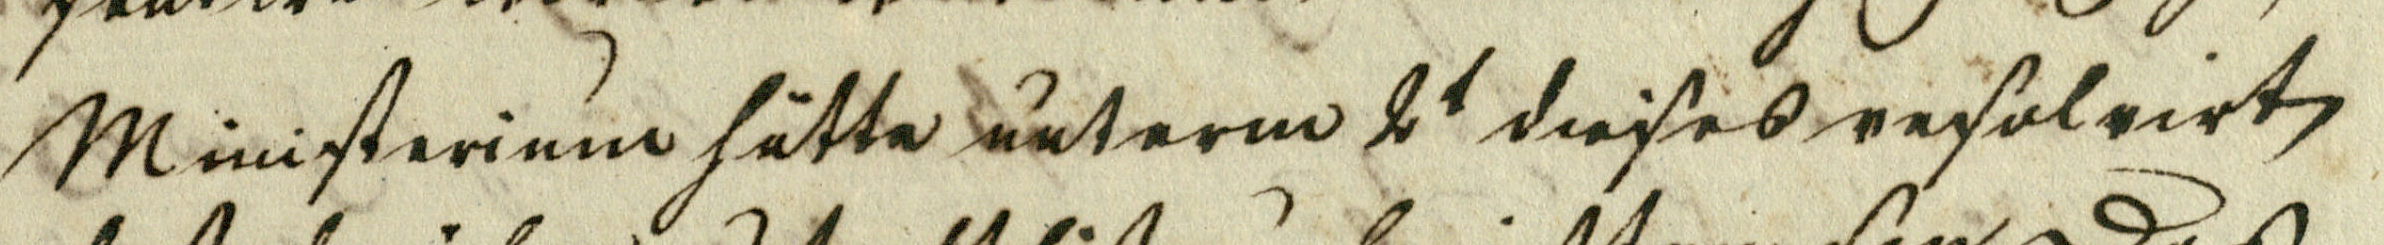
Ministerium hätte unterm 2 t dieses vesolvirt,
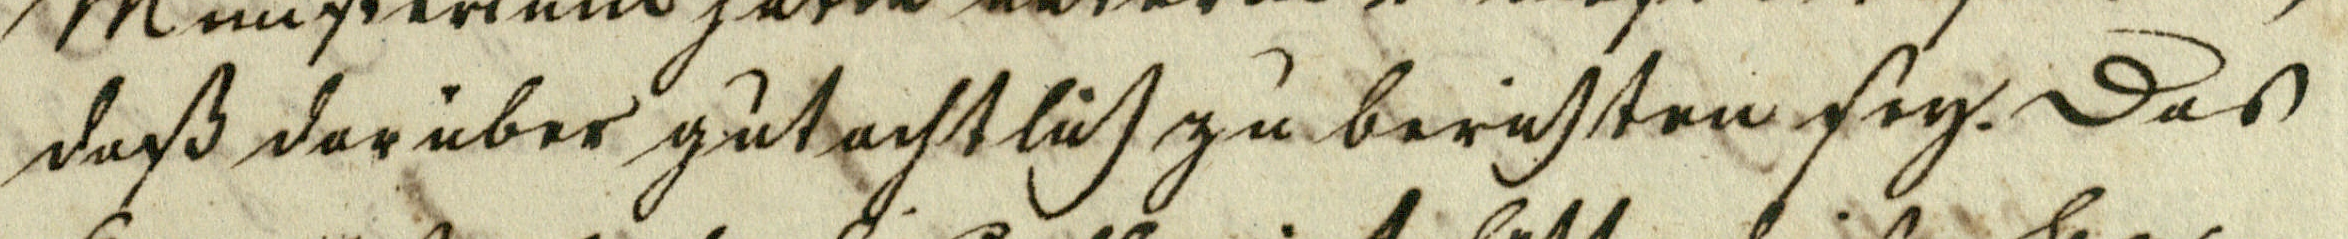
daß darüber gutachtlich zu berichten sey. Das
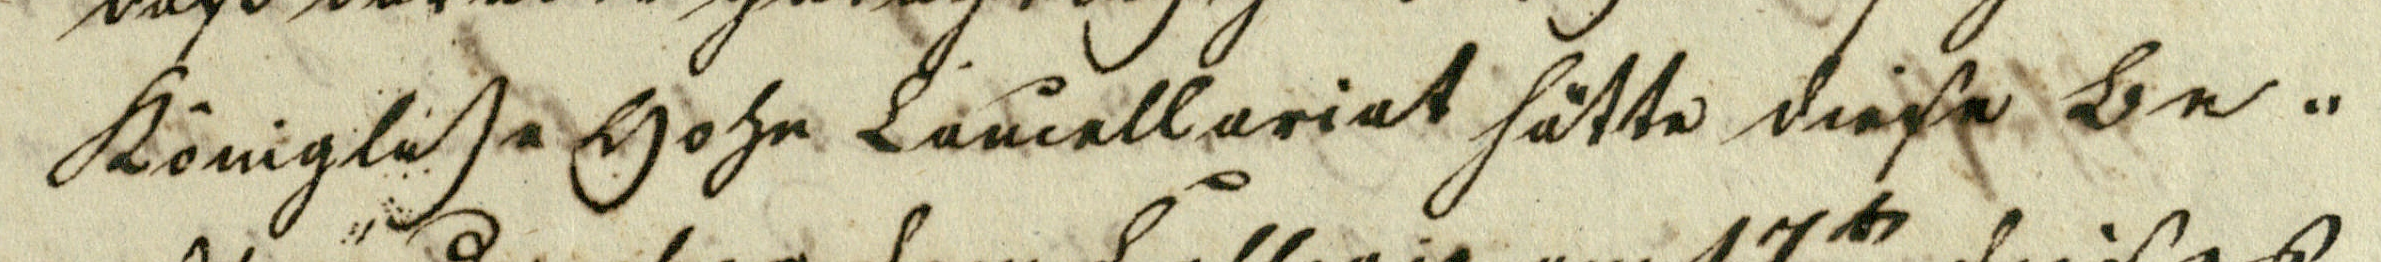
Königliche Hohe Cancellariat hätte diese Be¬
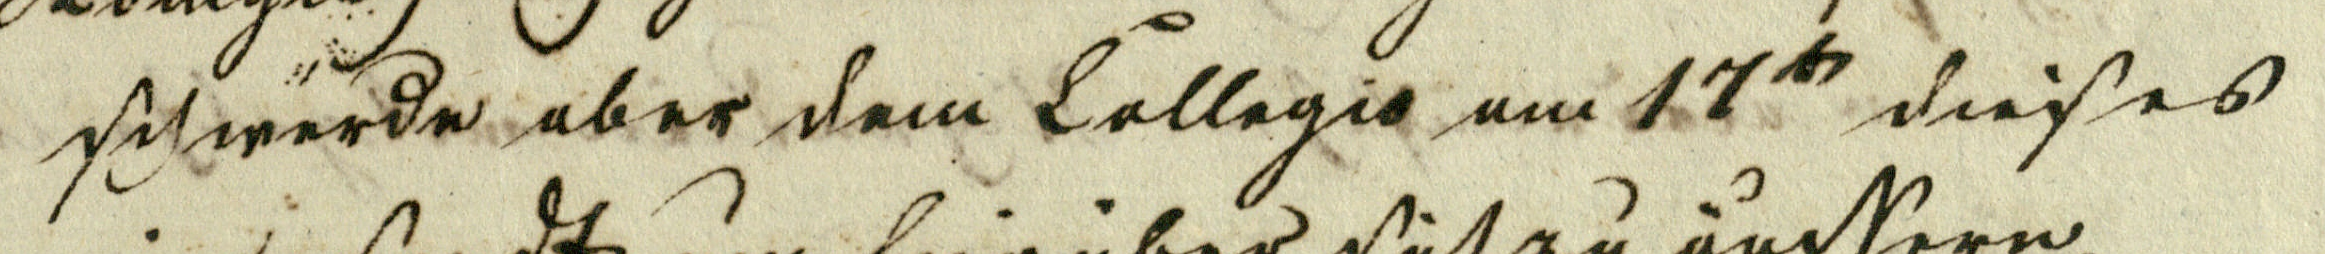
schwerde aber dem Collegio am 17 t dieses
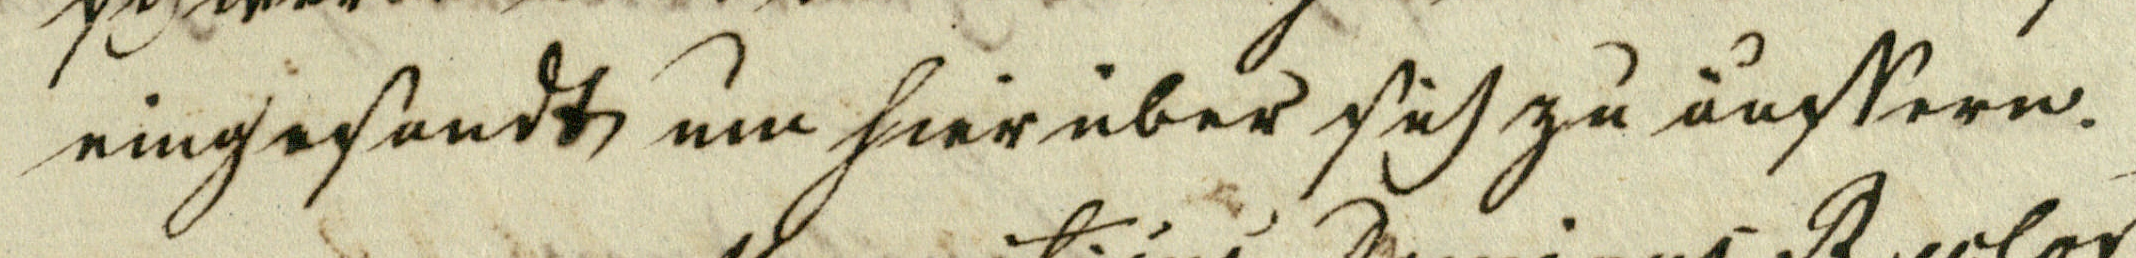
eingesandt, um hierüber sich zu äussern.
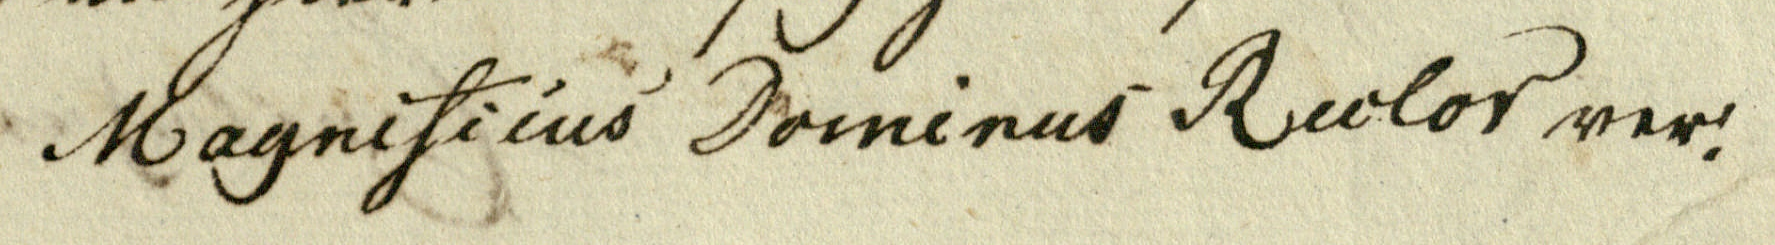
Magnificus Dominus Rector ver¬
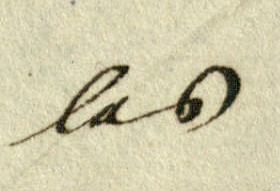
las
